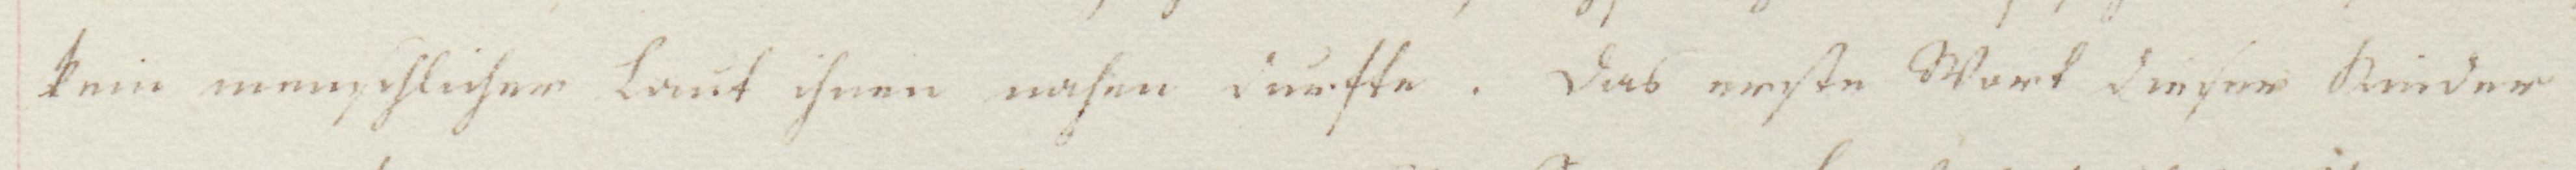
kein menschlicher Laut ihnen nahen durfte. Das erste Wort dieser Kinder
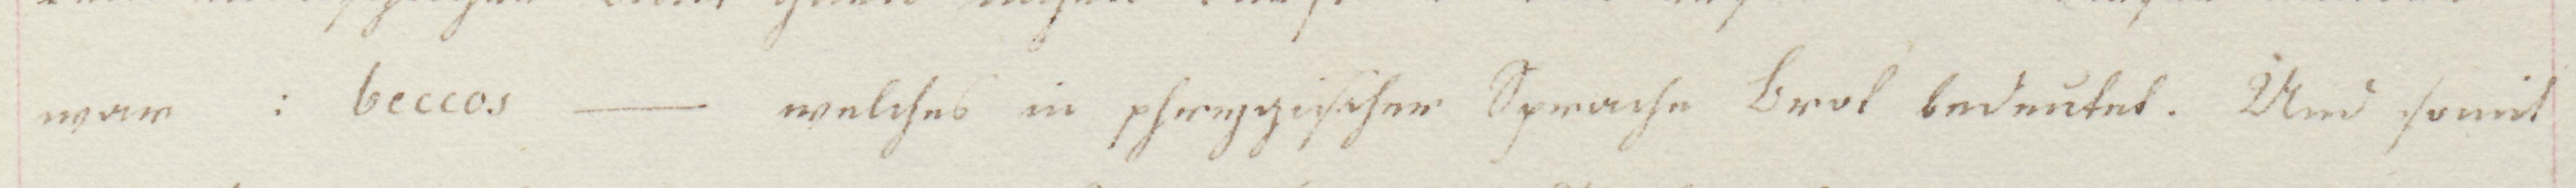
war: beccos – welches in phrygischer Sprache Brot bedeutet. Und somit
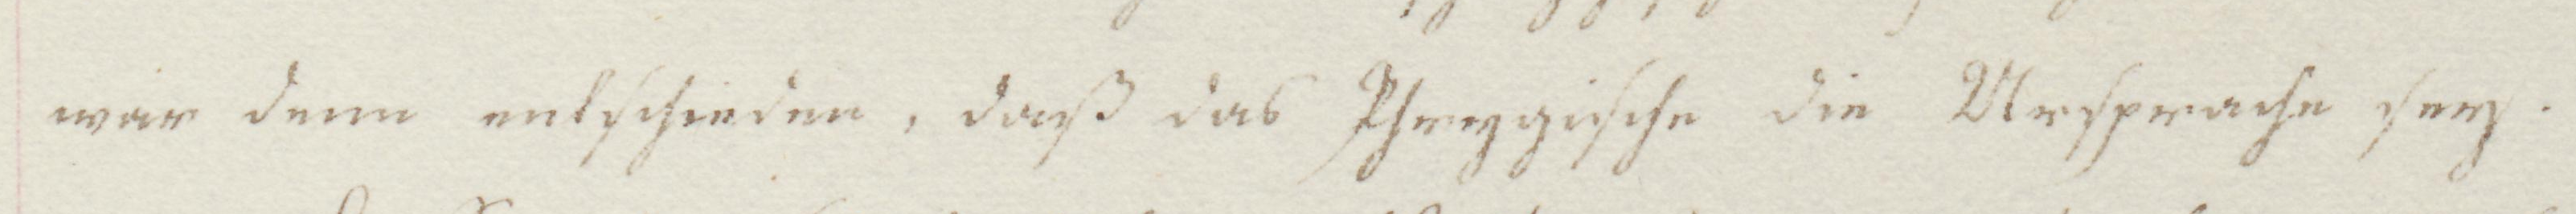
war denn entschieden, daß das Phrygische die Ursprache sey.
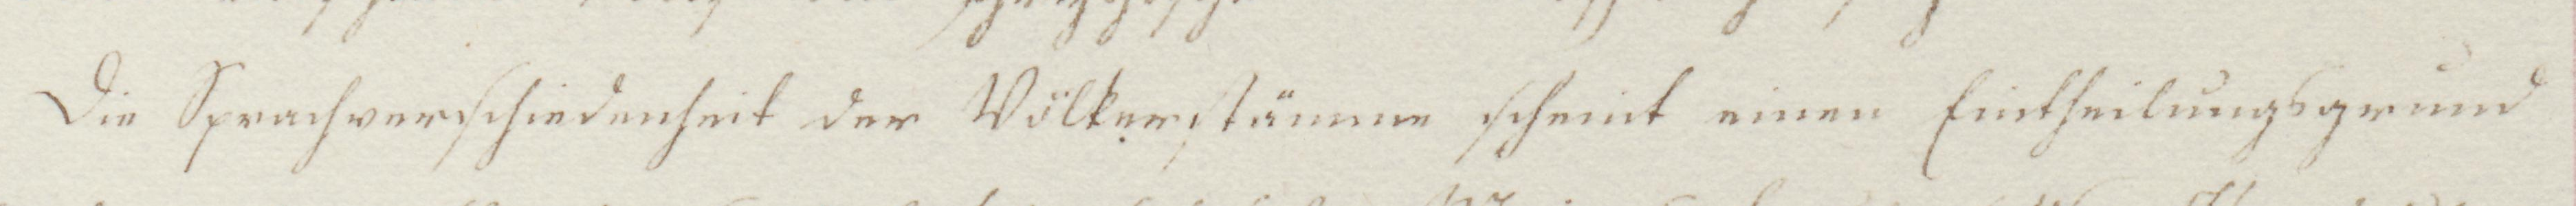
Die Sprachverschiedenheit der Völkerstämme scheint einen Eintheilungsgrund
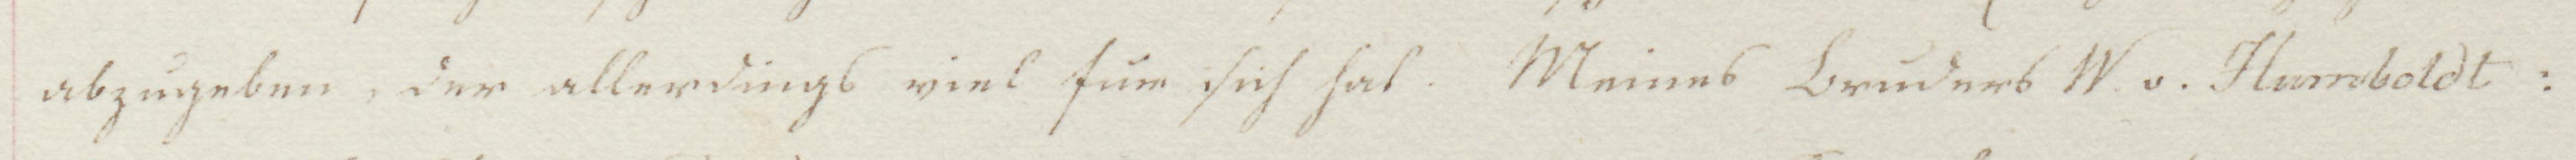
abzugeben, der allerdings viel für sich hat. Meines Bruders W. v. Humboldt:
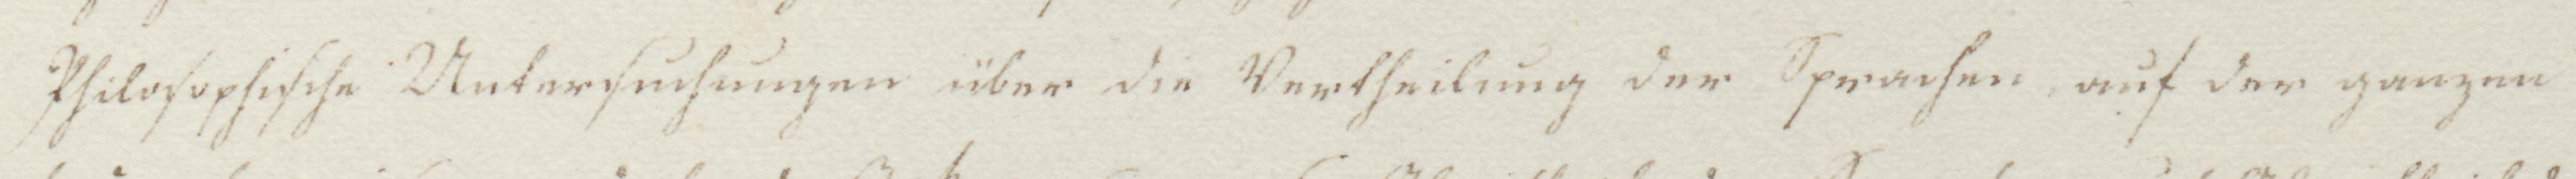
Philosophische Untersuchungen über die Vertheilung der Sprachen, auf der ganzen
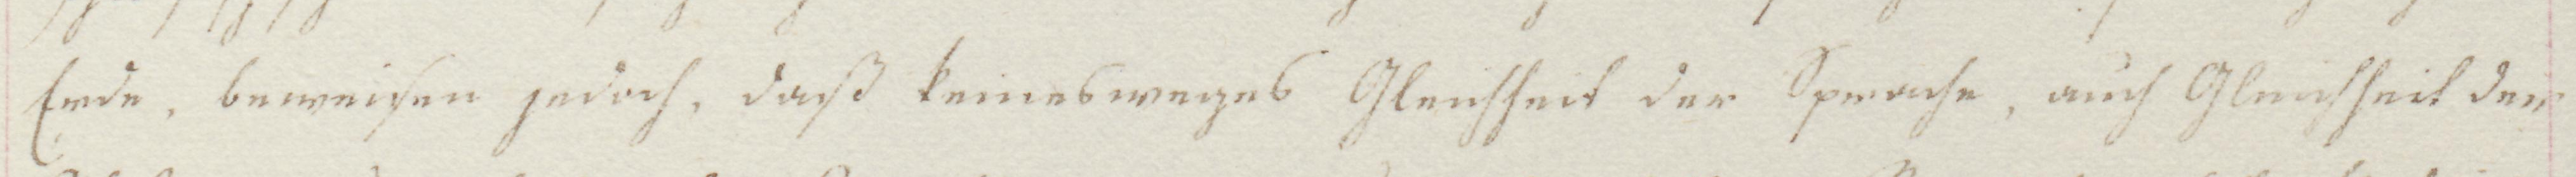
Erde, beweisen jedoch, daß keinesweges Gleichheit der Sprache, auch Gleichheit der
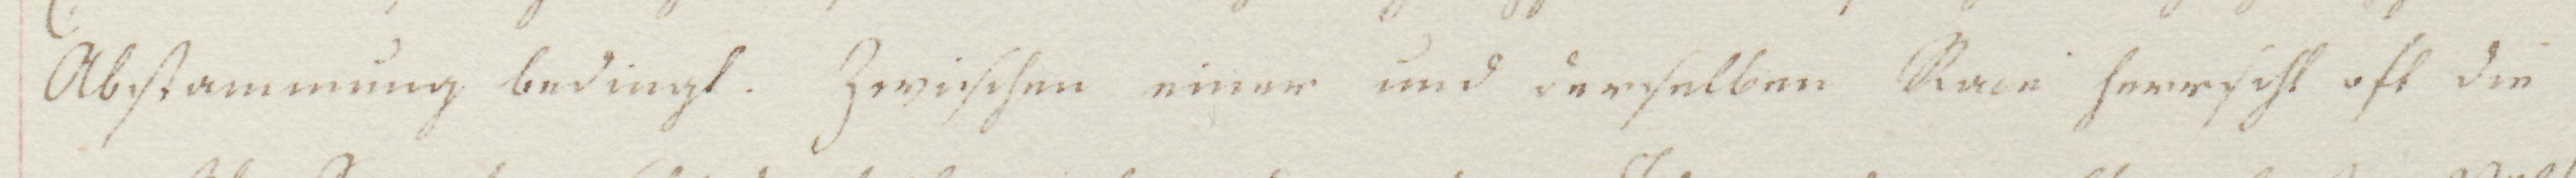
Abstammung bedingt. Zwischen einer und derselben Race herrscht oft die
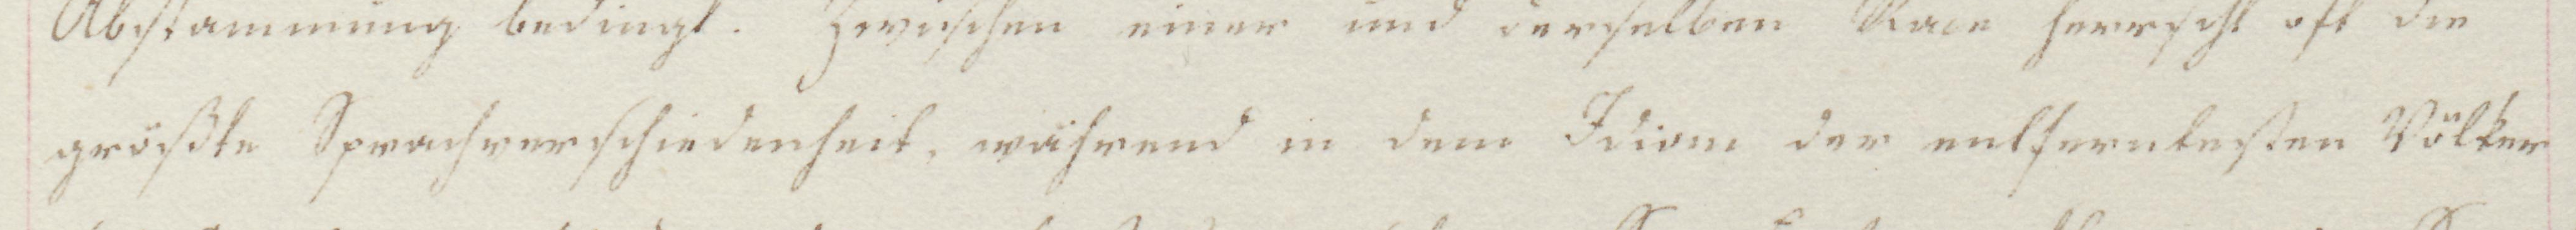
größte Sprachverschiedenheit, während in dem Idiom der entferntesten Völker
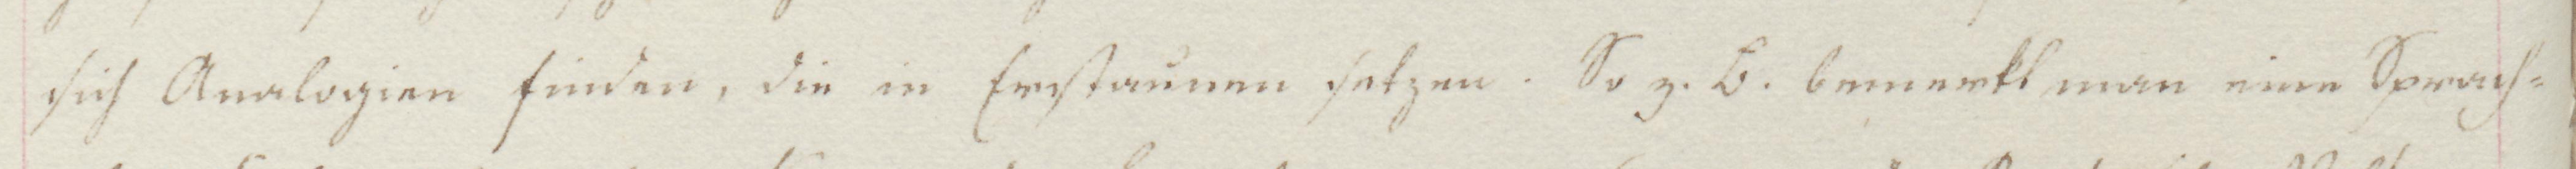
sich Analogien finden, die in Erstaunen setzen. So z. B. bemerkt man eine Sprach-
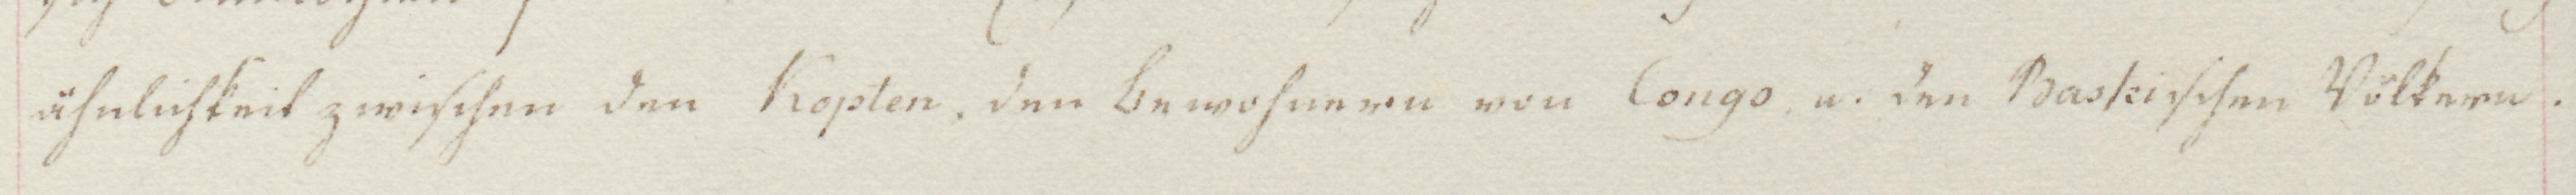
ähnlichkeit zwischen Kopten, den Bewohnern von Congo u. den Baskischen Völkern.
